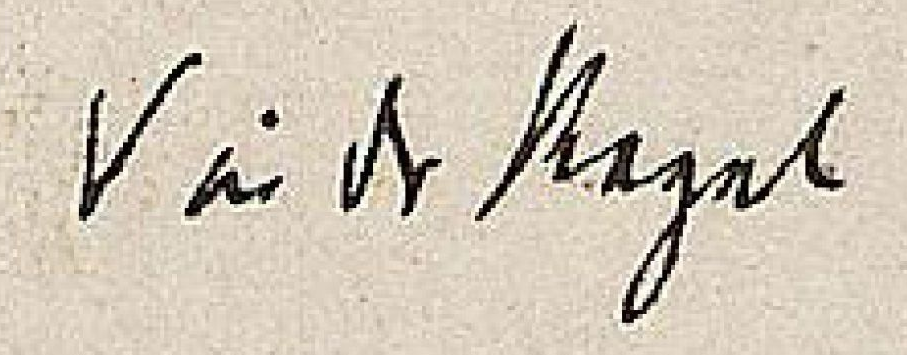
in der Regel
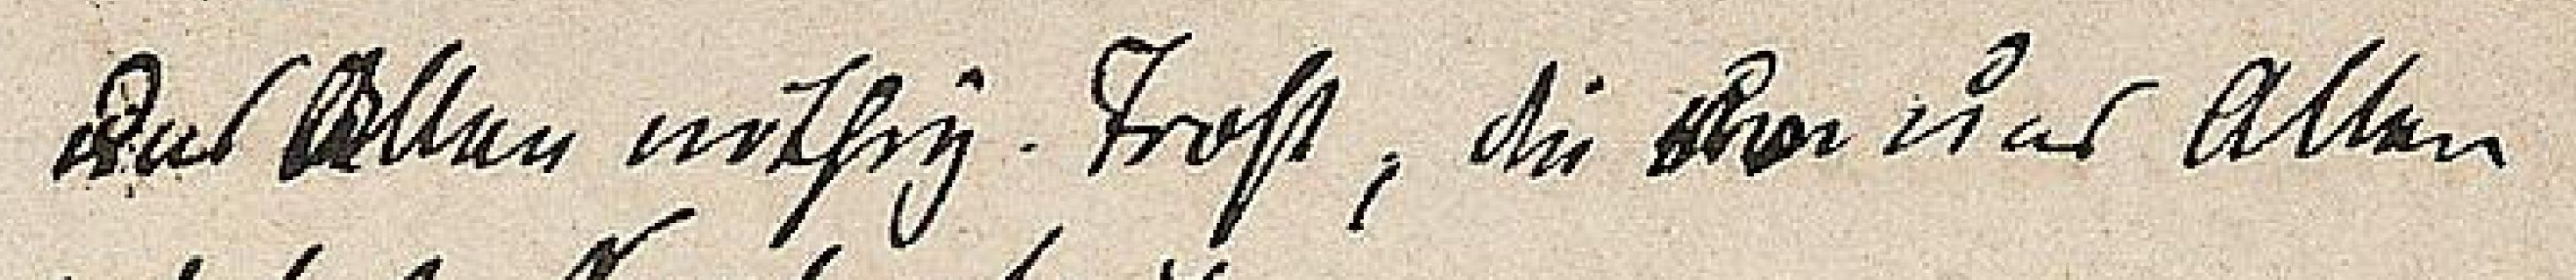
uns Allen nöthig. Trost, die von uns Allen
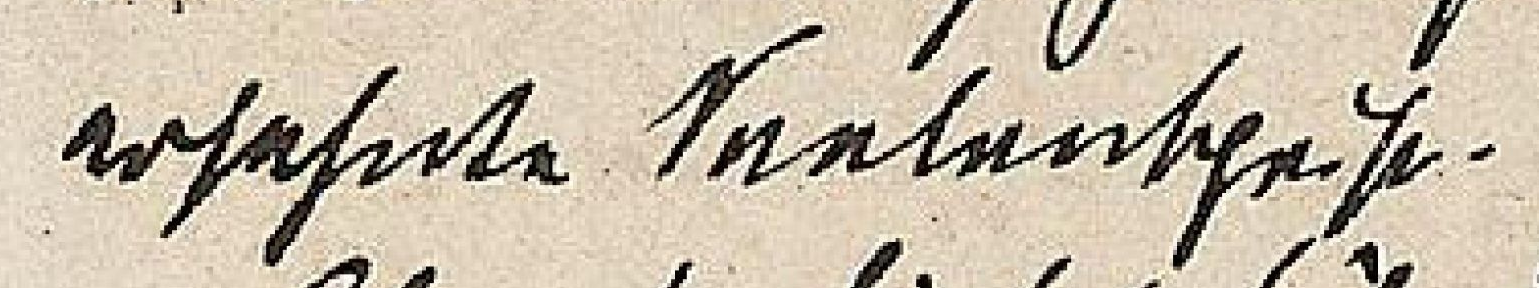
ersehnte Seelenspeise.
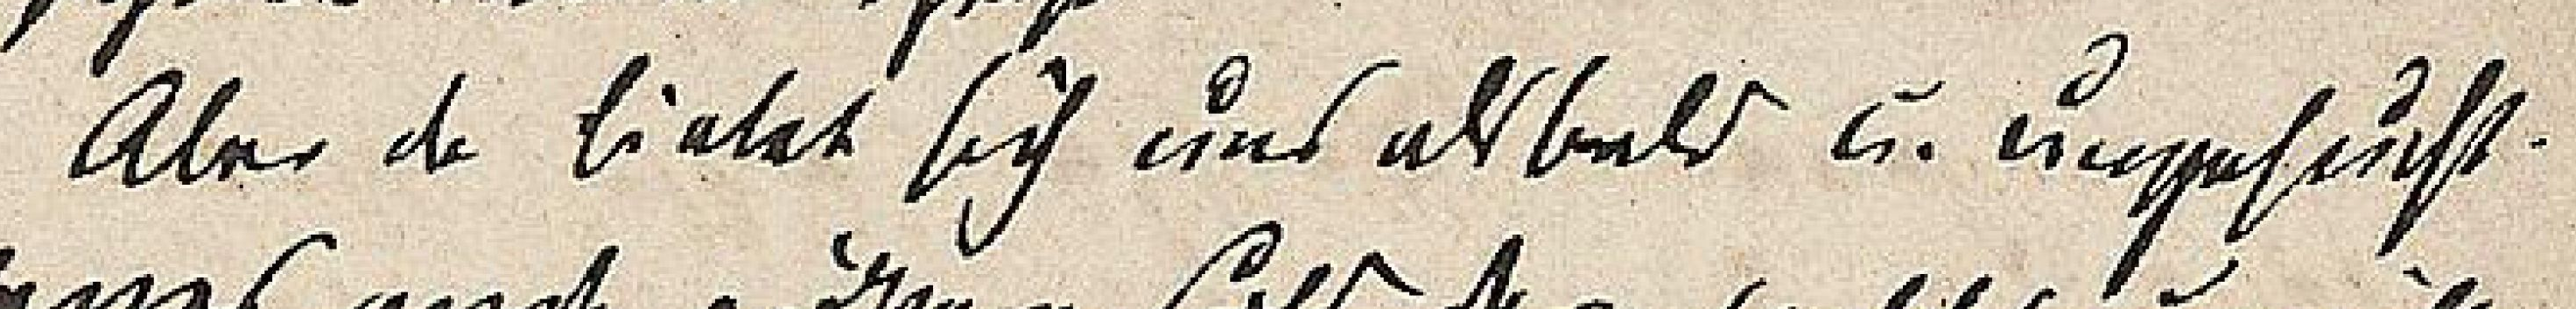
Aber da bietet sich uns alsbald u ungesucht
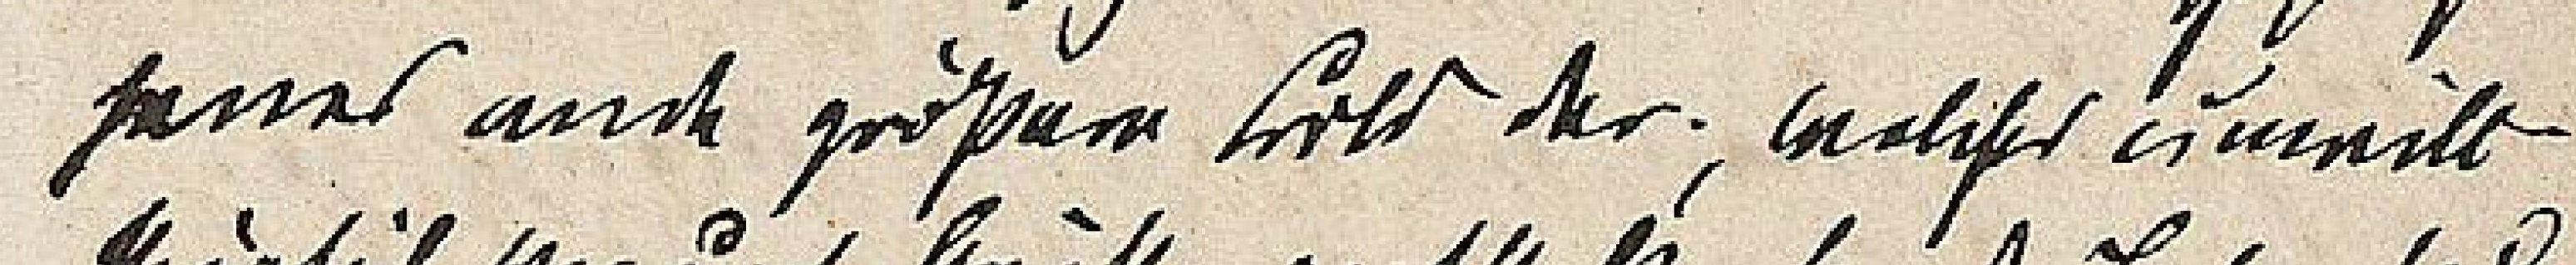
jenes andr größere Bild dar; welches unwill¬
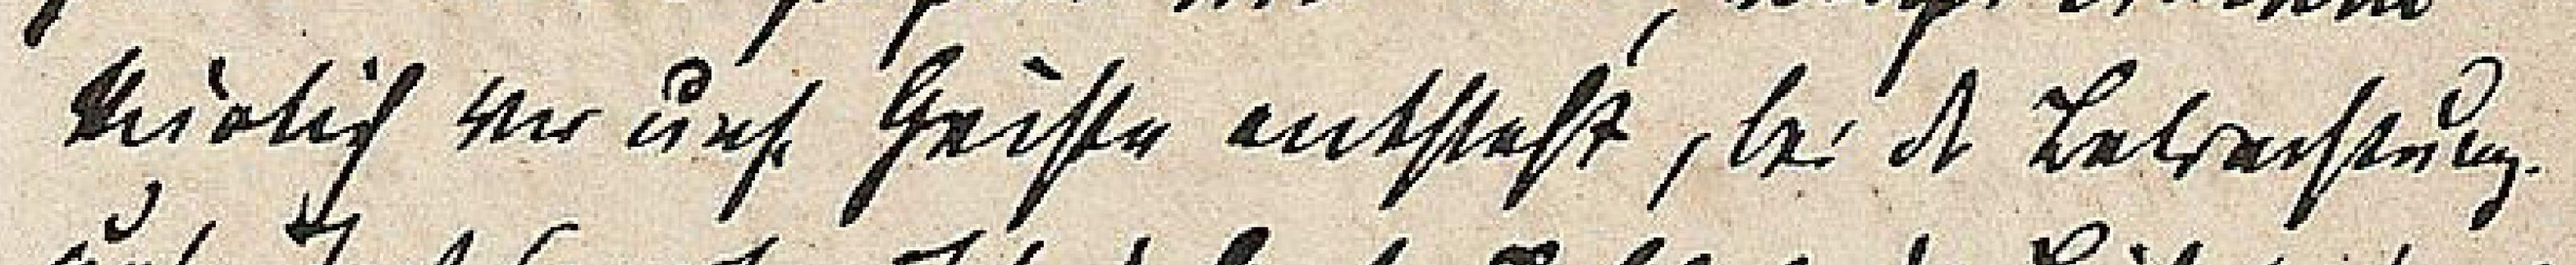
kürlich vor uns Geiste entsteht, bei der Betrachtung
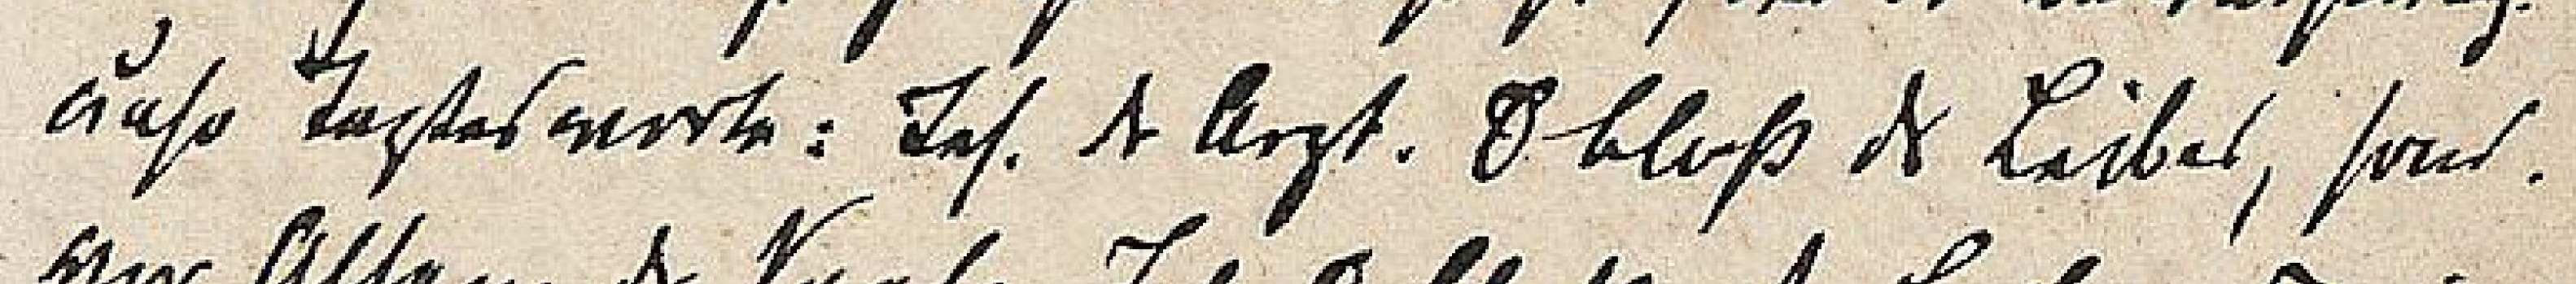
unser Textesworte: Jes. dr Artz o bloß des Leibes, sond.
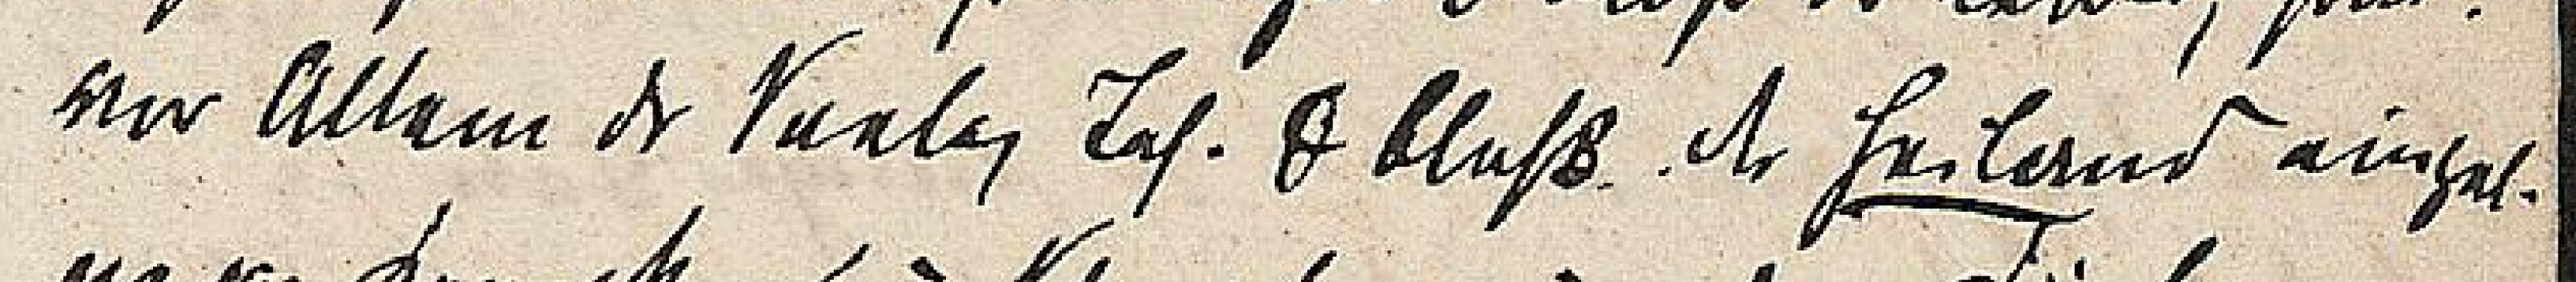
vor Allem der Seele, Jes o bloß der Heiland einzel¬
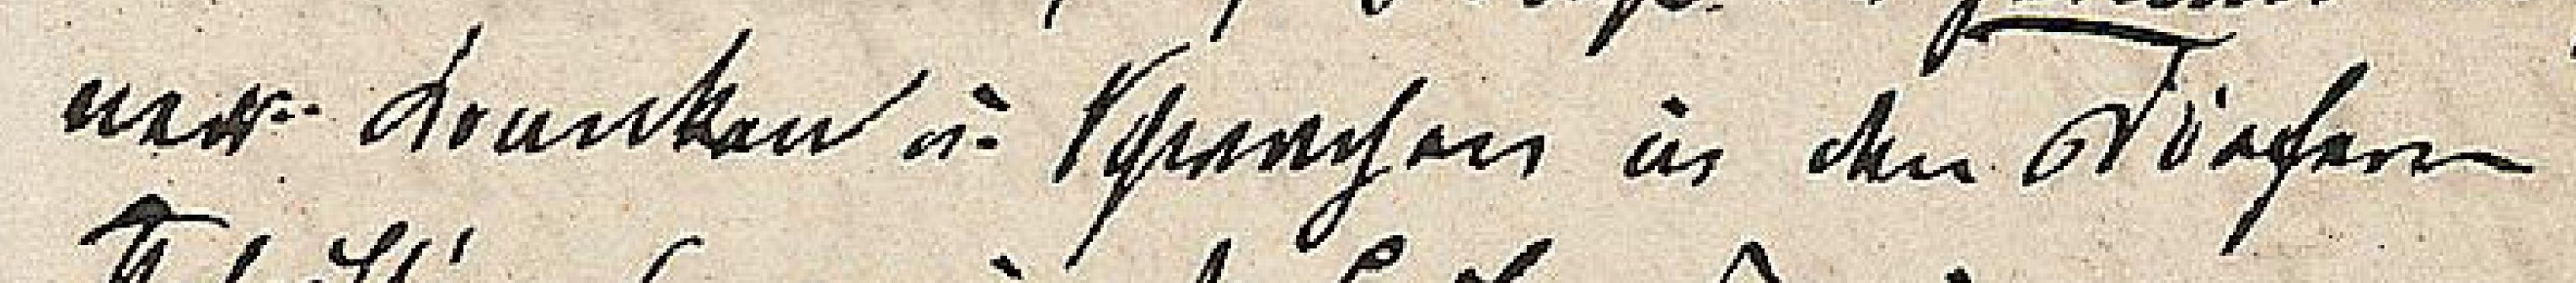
ner Kranken u. Schwachen in den Dörfern
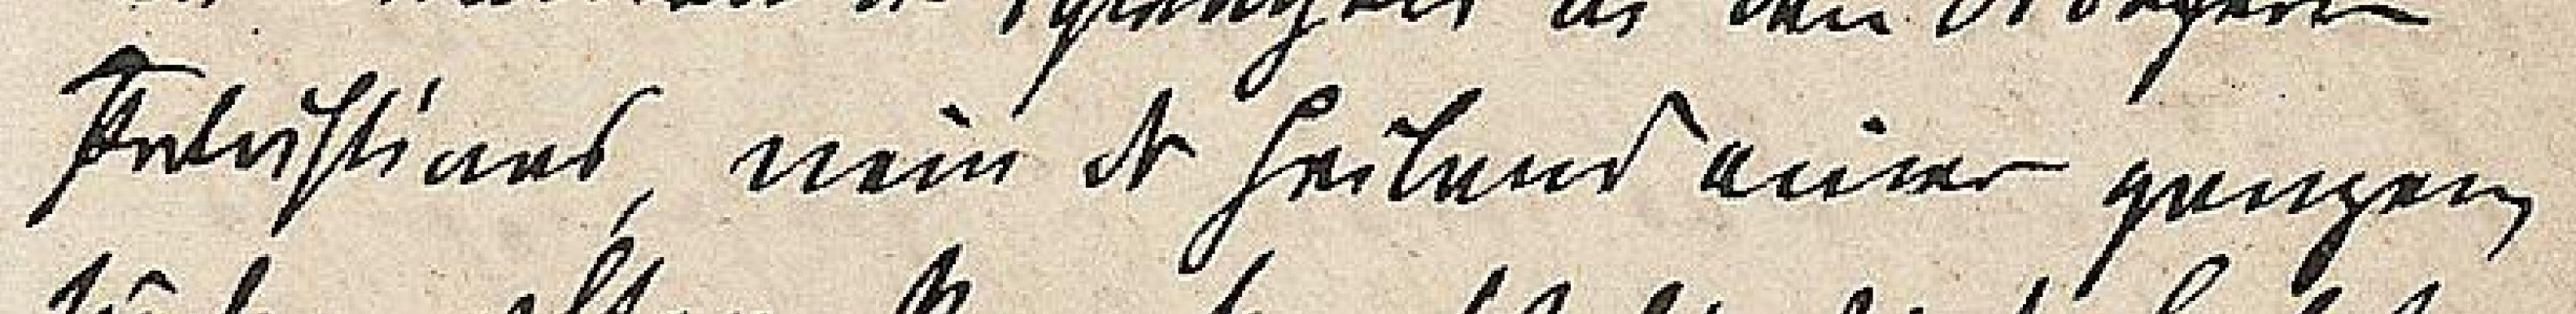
Palästinas, mein der Heilend einer ganzen,
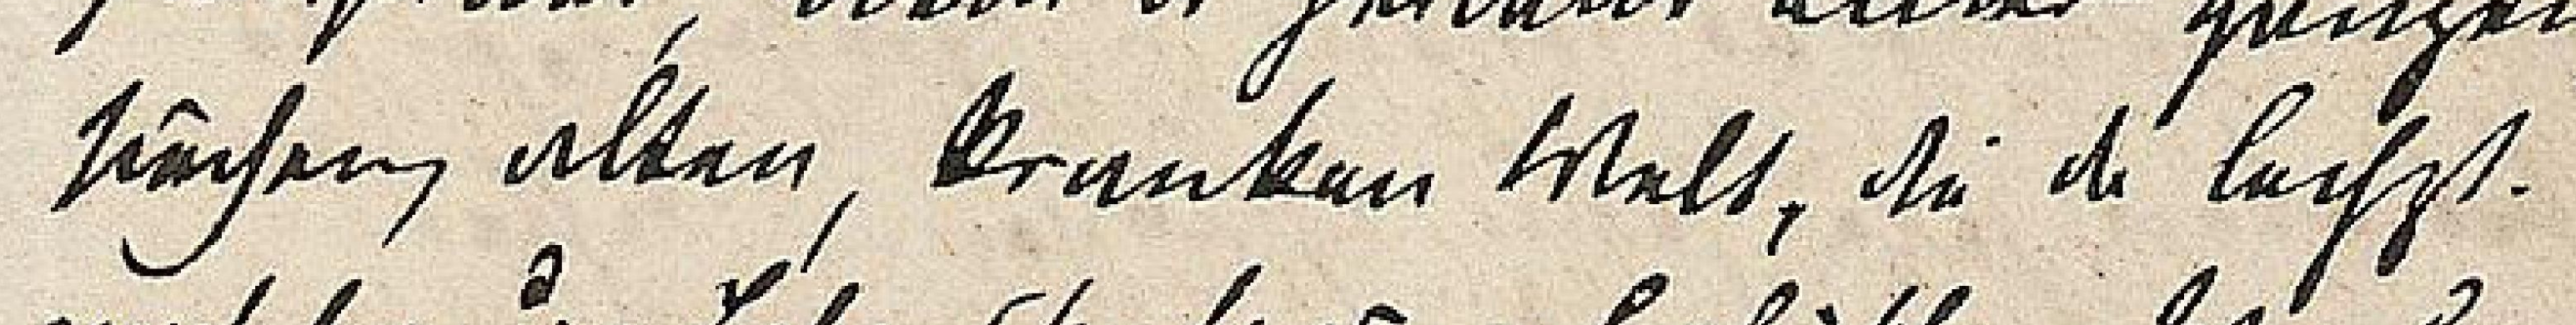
siechen, alten, kranken Welt, die da lechzt.
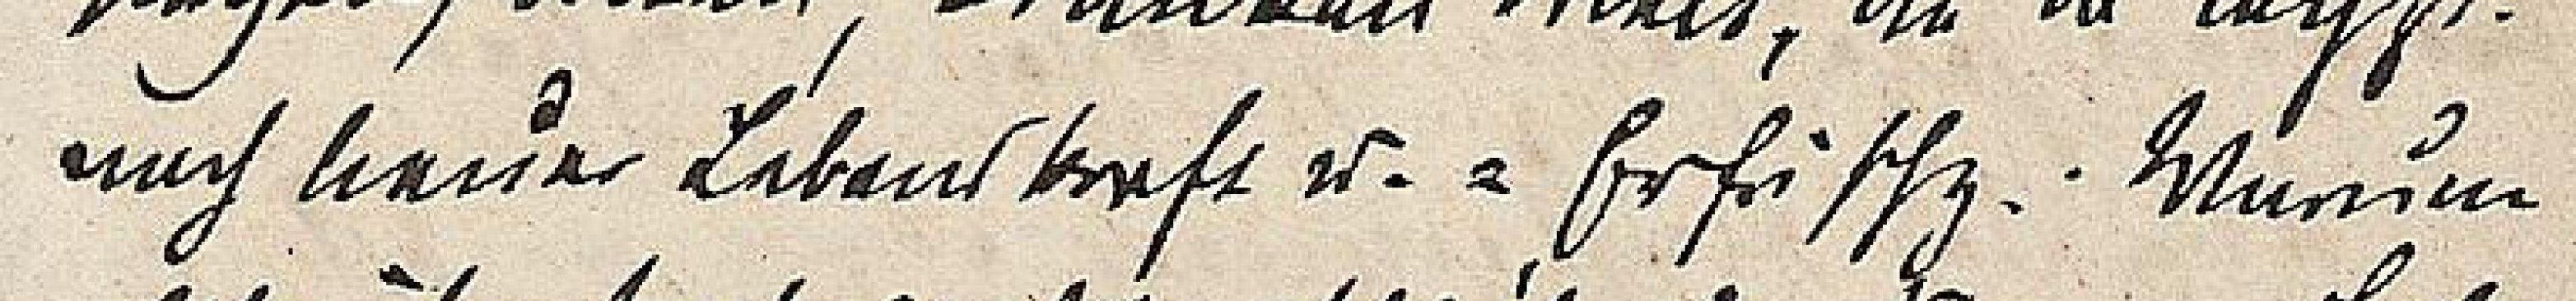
nach neuer Lebenskraft u.: Eerfrischg. Warum
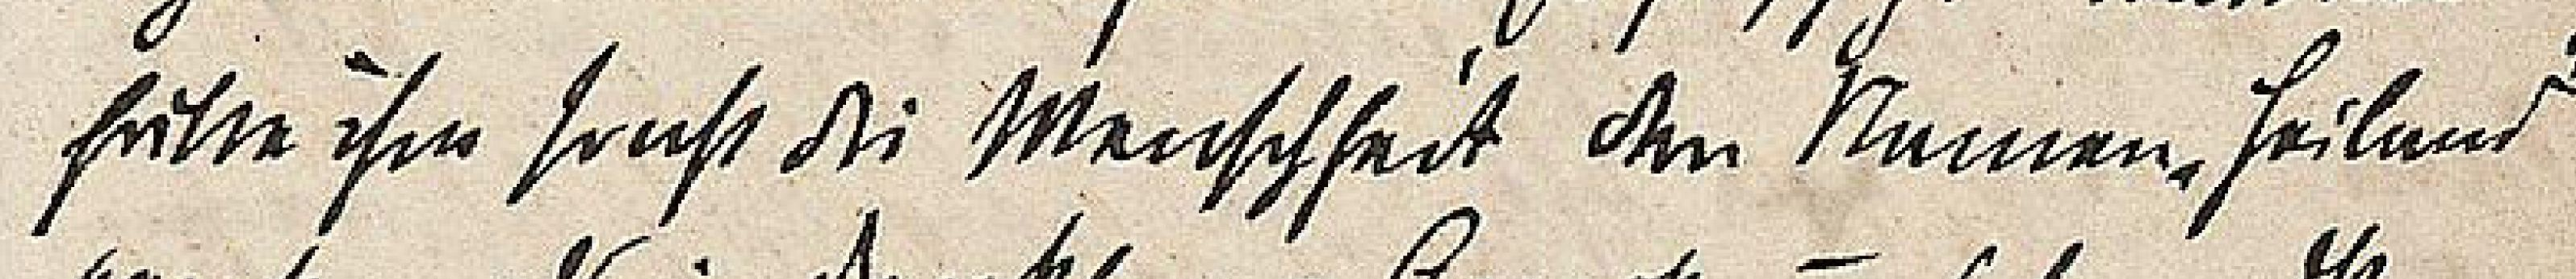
hätte ihm sonst die Menschheit den Namen "Heiland"
